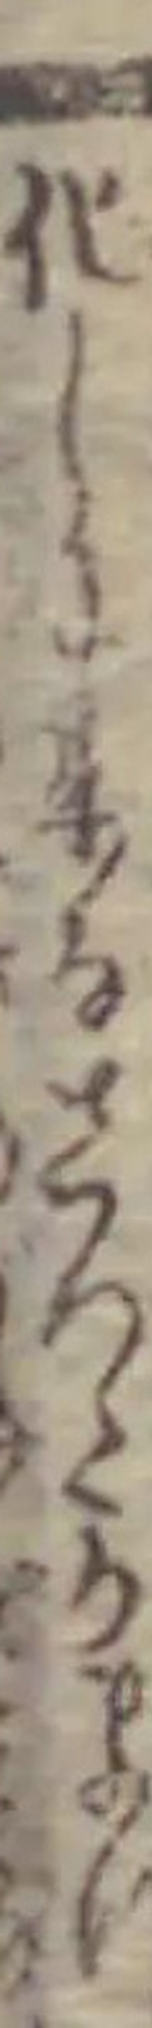化しに来なさつたかまづ
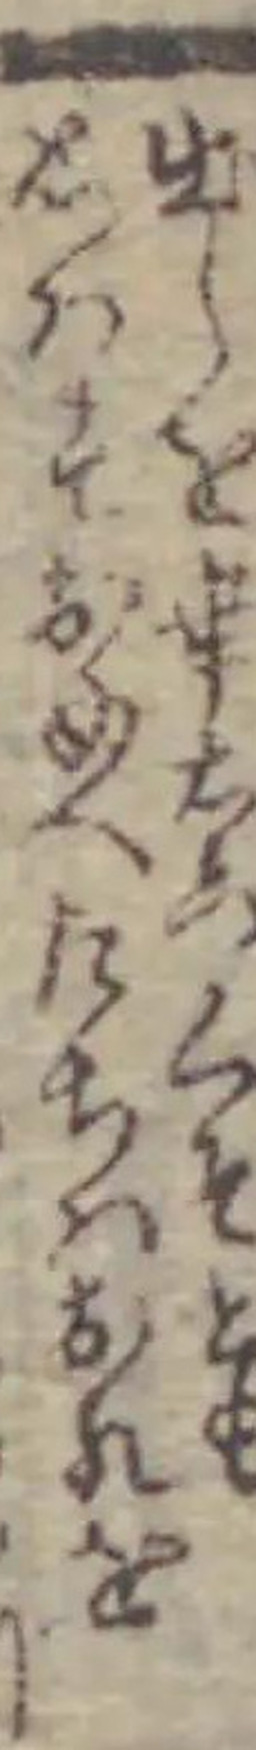思はすおめへたちはおれを
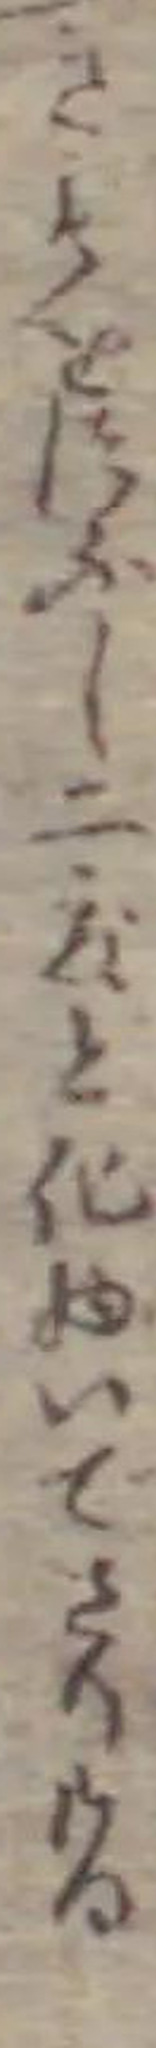きもをつふし二度と化物いでさりける
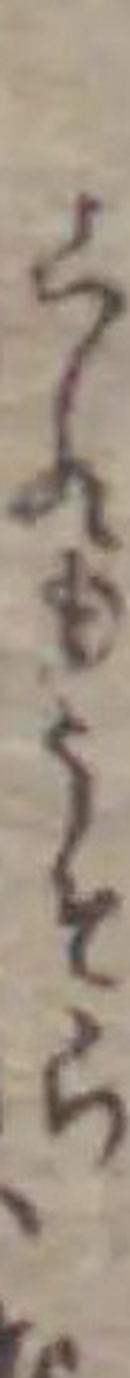これもうそら

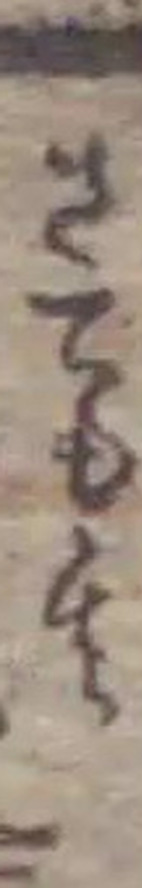さても其
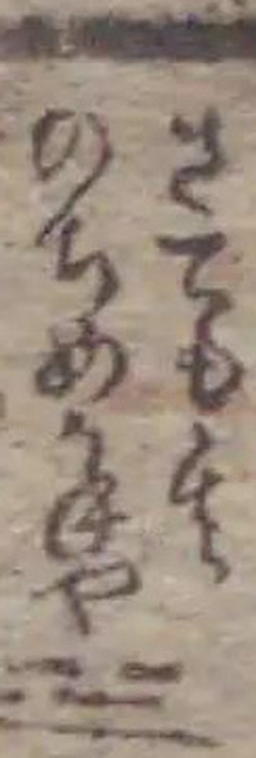のちめかねや
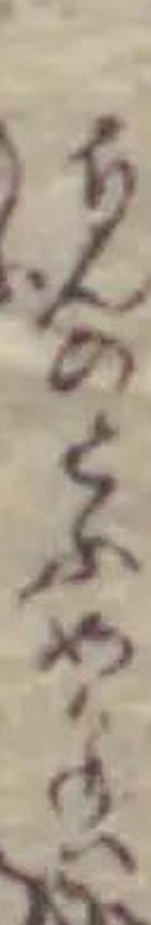ほんのとふめかねは
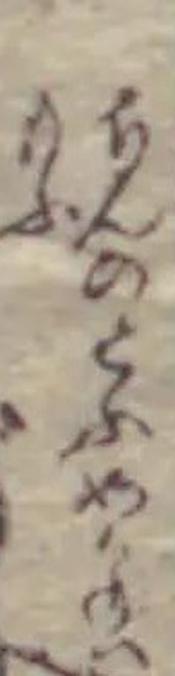ほんのとふめかねは
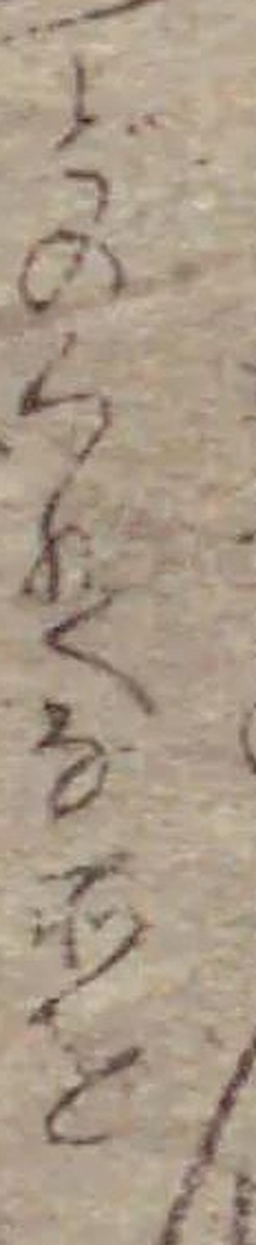どのくれへな所を
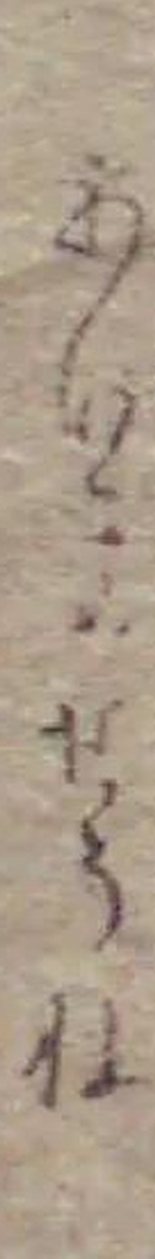あげませうね
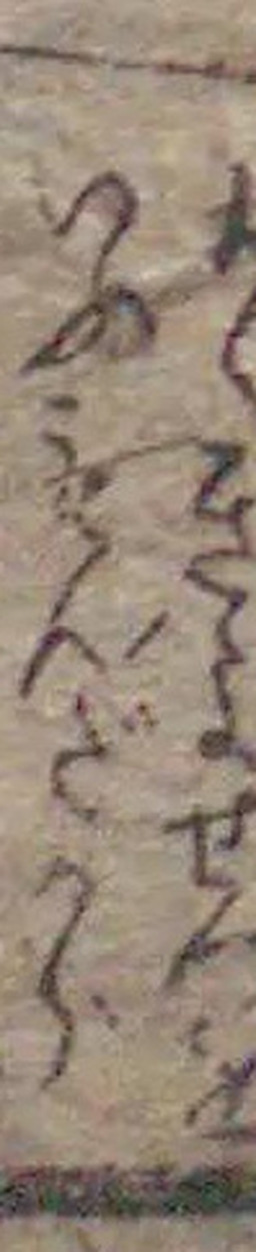いふもんだから

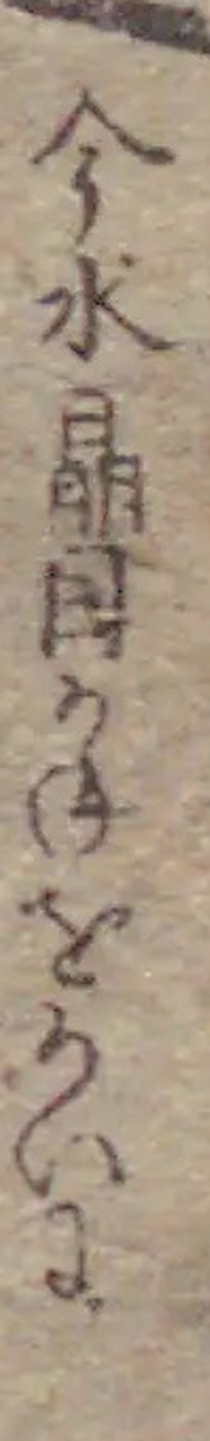今水晶目かねをかいに
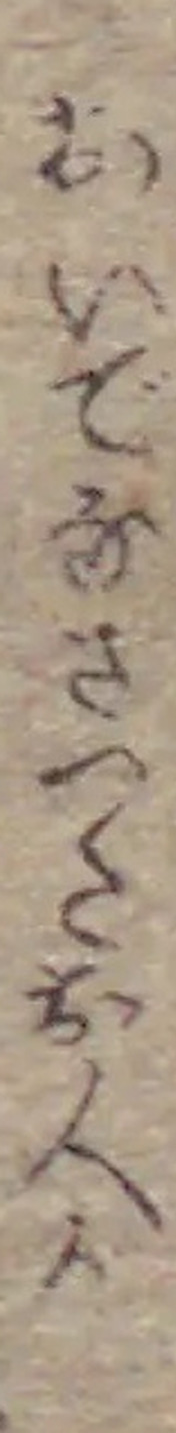おいでなさつたお人が
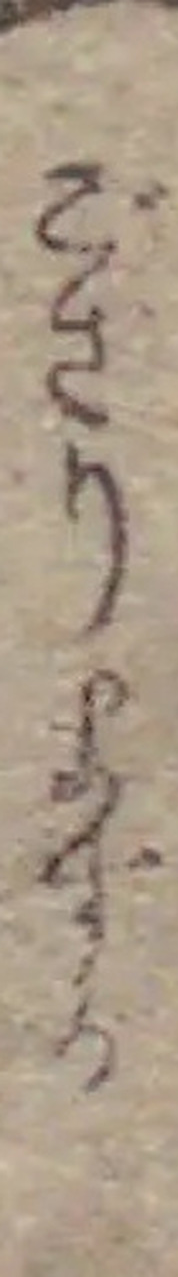ござりますが
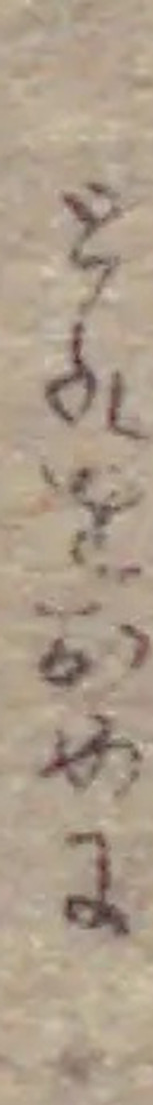とれをおめに
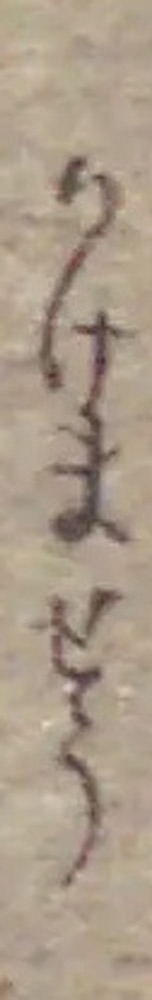かけませう
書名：栄増眼鏡徳 3巻
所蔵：国立国会図書館 National Diet Library, JAPAN
